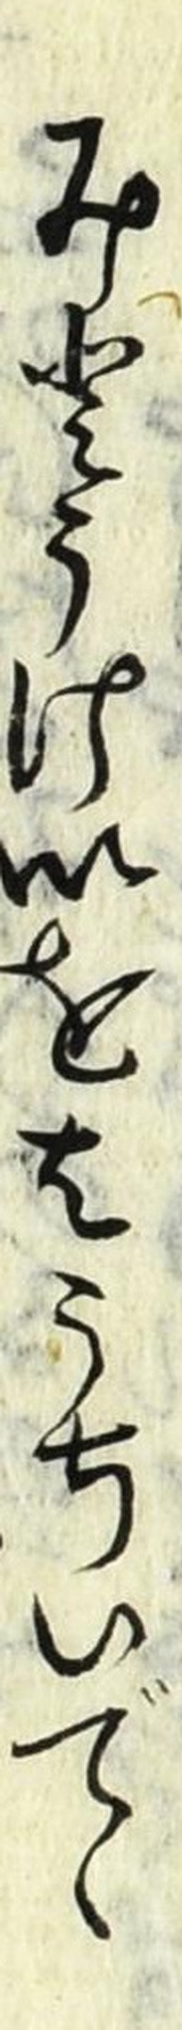みとうけいをはうちいでゝ
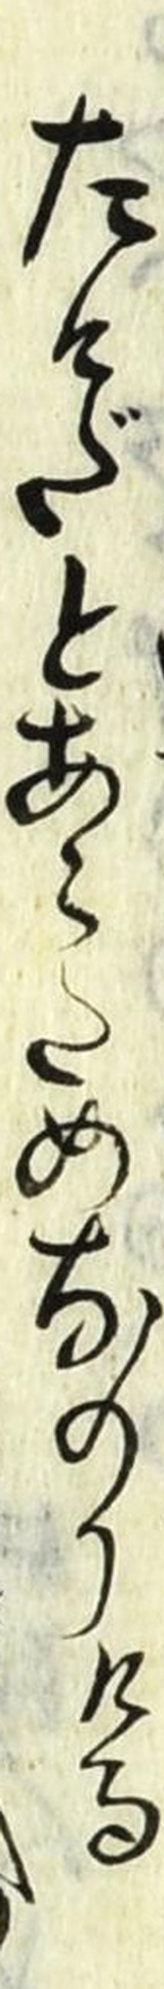たけだとあらためなのりける
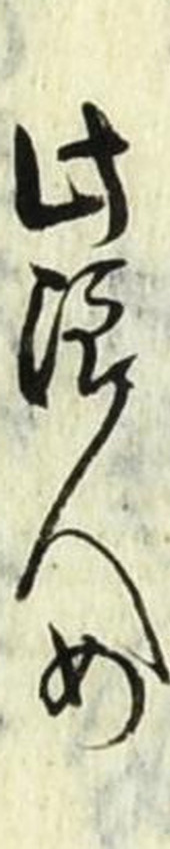此浪人め
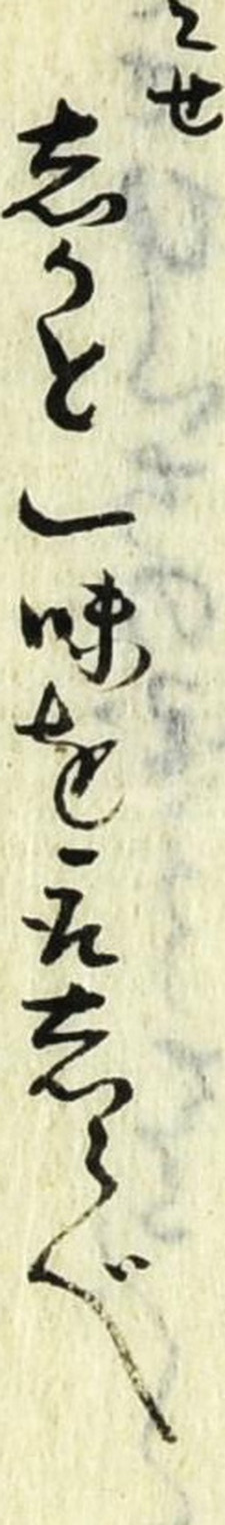しかと一味を取しらべ
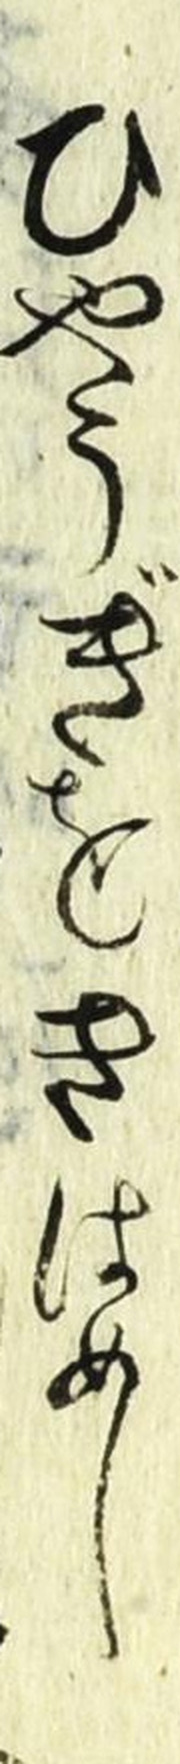ひやうぎをきはめし
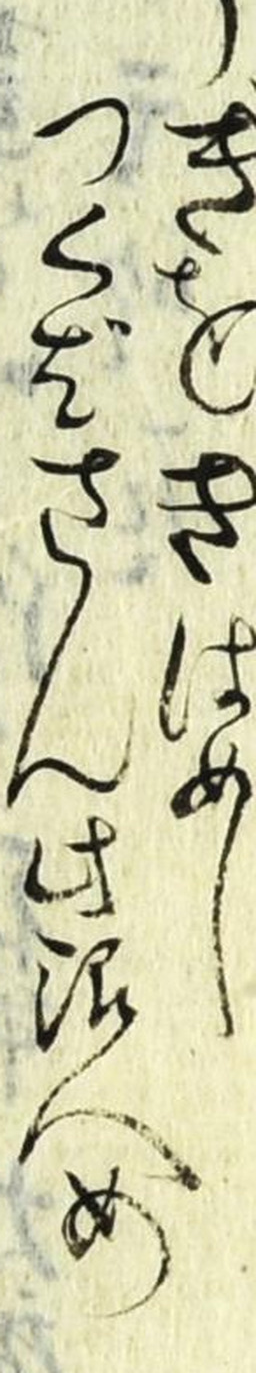つくばさん此浪人め
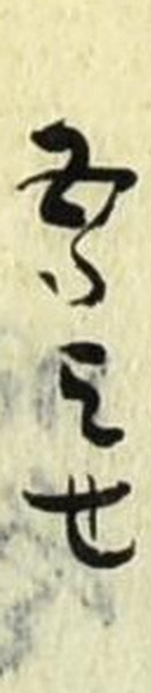五ツとせ
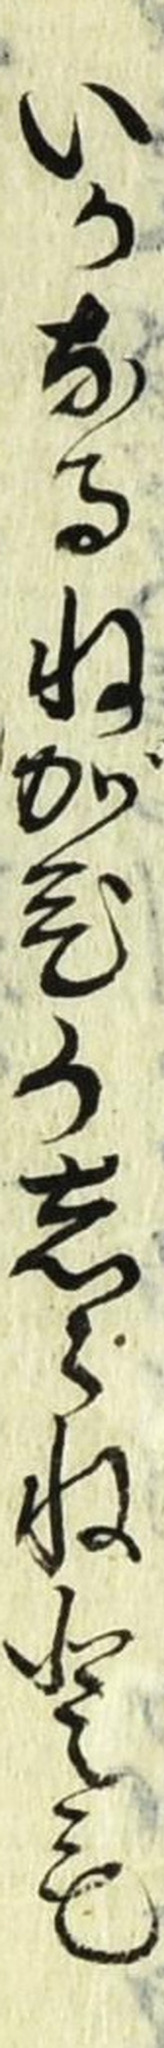いかなるねがひかしらねとも
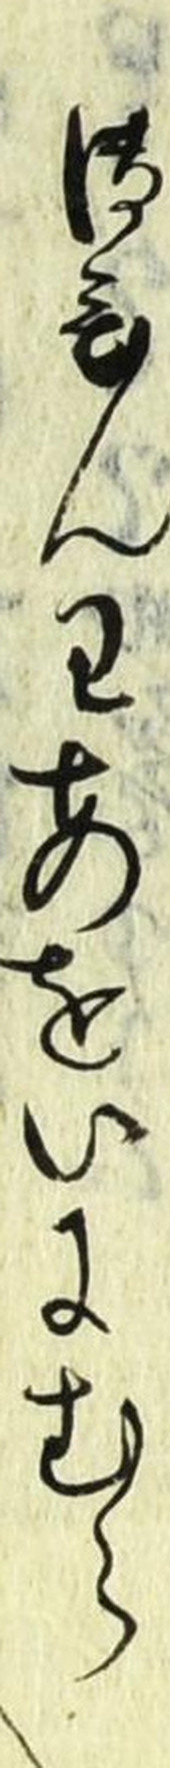御もんわあをいにむら
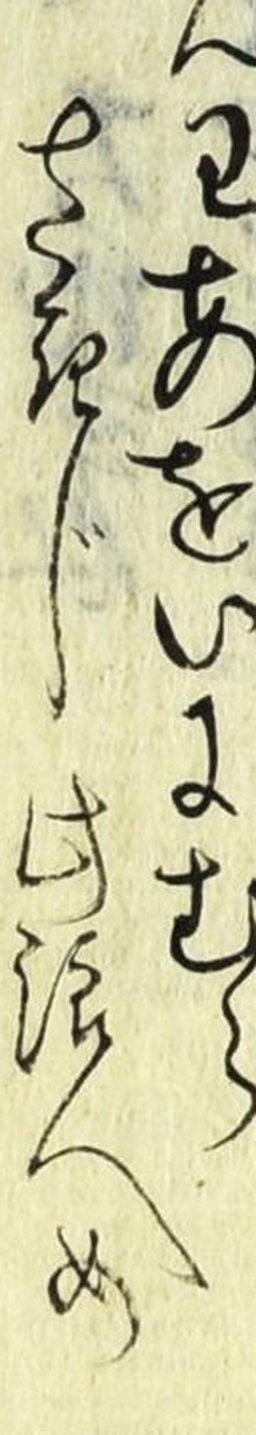さきじ此浪人め
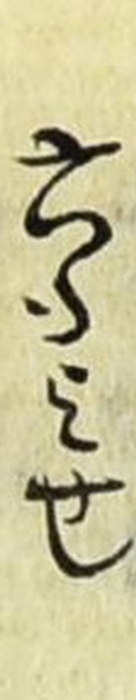六ツとせ
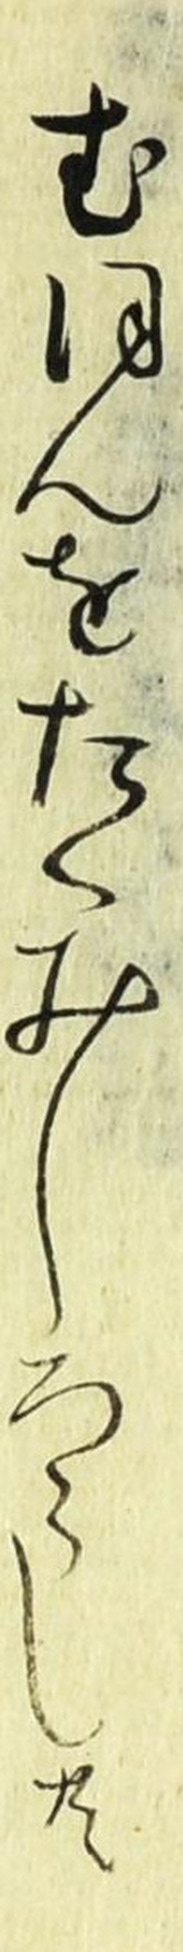むほんをたくみしろうし共
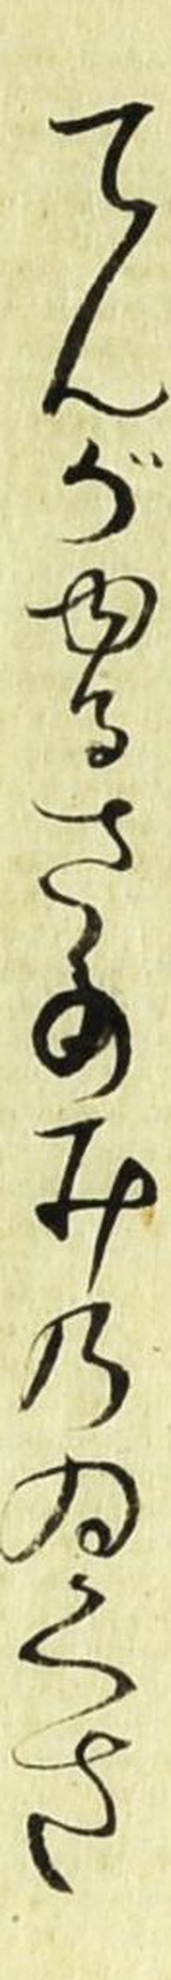てんがゆるさねみのゐくさ
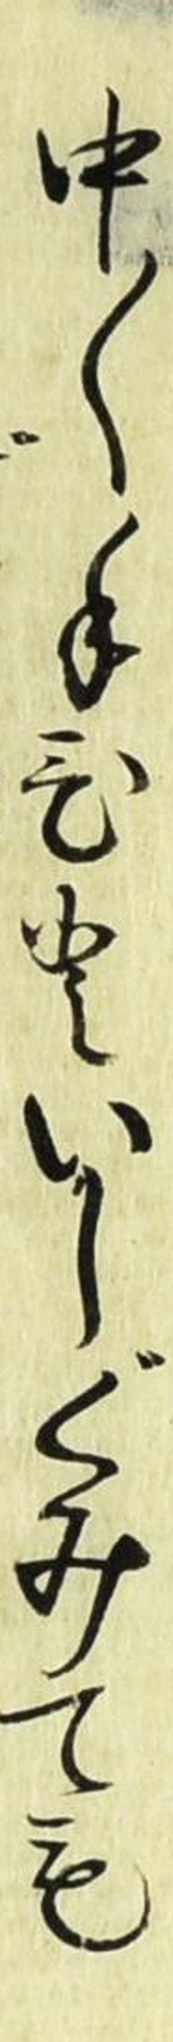中〳〵てひといしぐみても
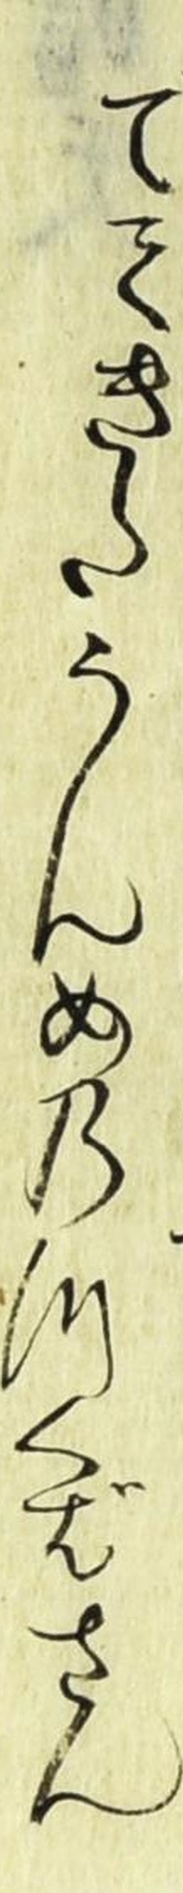でてきたうんめのつくばさん
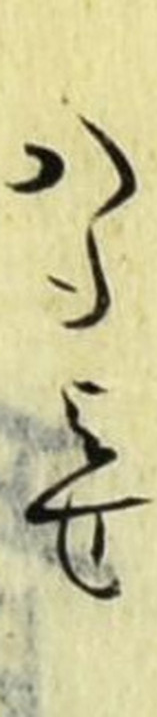八ツとせ
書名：（日記）
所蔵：福井県文書館 Fukui Prefectural Archives
